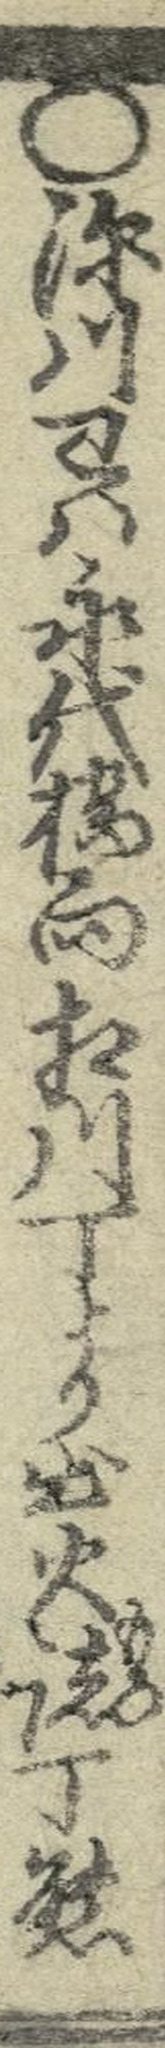〇深川辺ハ永代橋向相川丁より出火諸丁熊
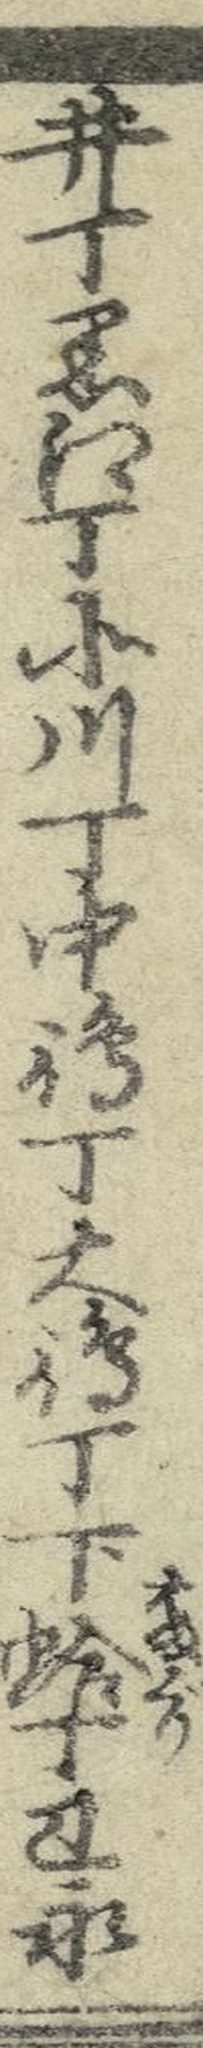井丁黒江丁小川丁中嶋丁大嶋丁下蛤丁辺永
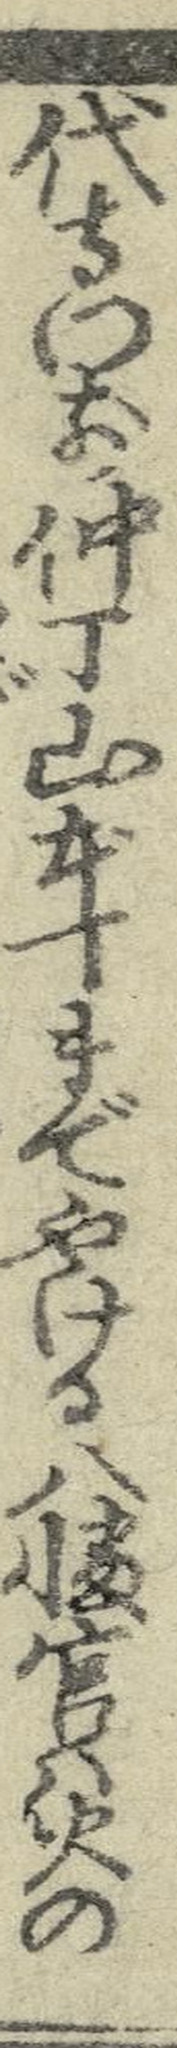代ち門前仲丁山本丁までやける八幡宮ハ火の
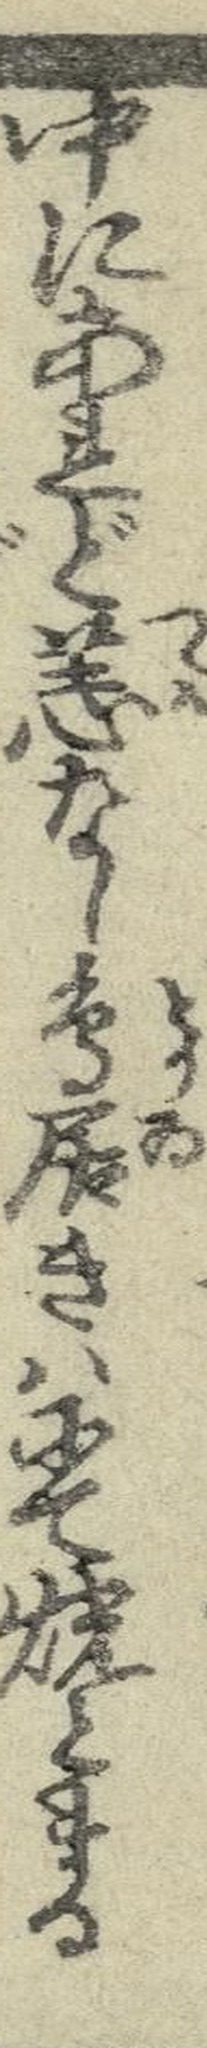中にあれど恙なし鳥居きハにて焼とまる
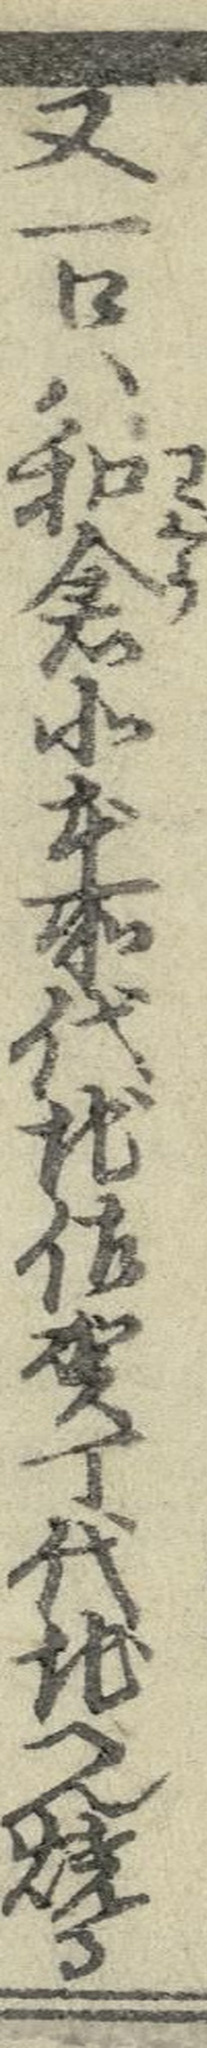又一口ハ和倉北本所代地佐賀丁代地へん焼る
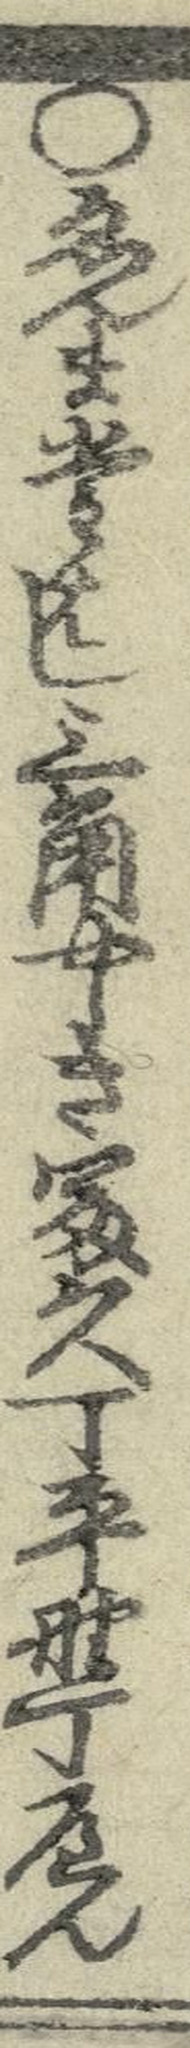〇えんま堂はし三角やしき冨久丁平野丁へん
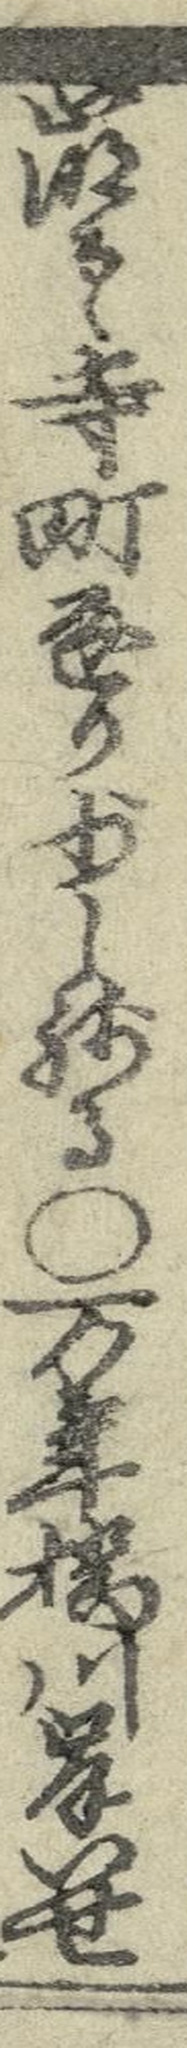崩るゝ寺町通り少し残る〇万年橋川岸いせ
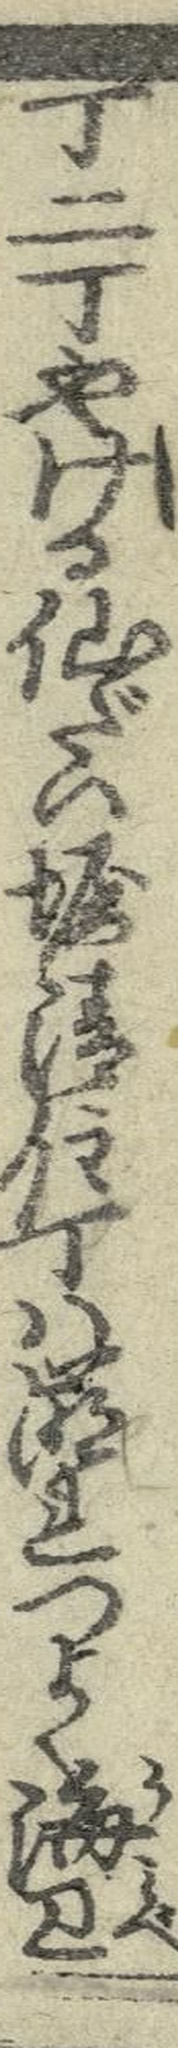丁二丁やける仙だい堀清住丁ハ崩れつよく海辺
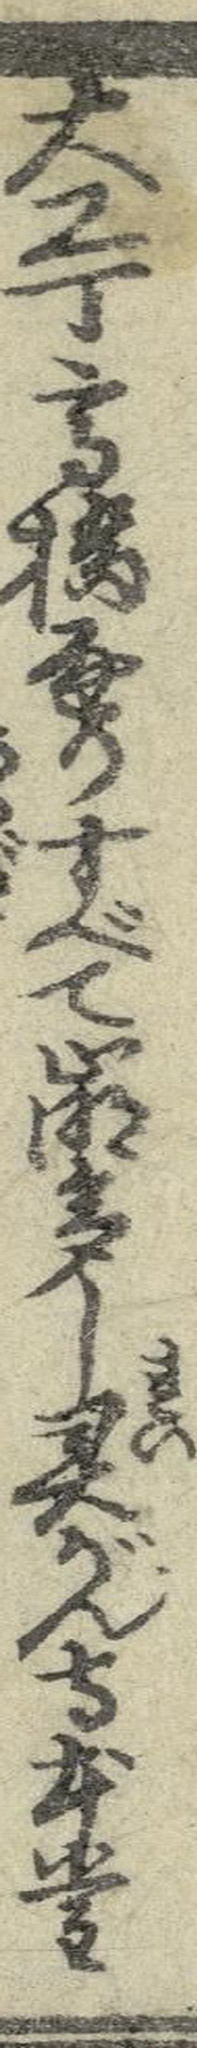大工丁高橋通りすべて崩多し㚑がん寺本堂
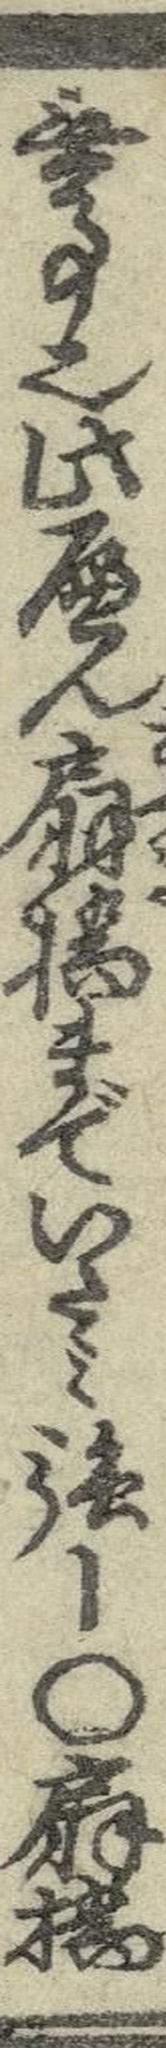無事也此へん扇橋までいたみ強し〇扇橋
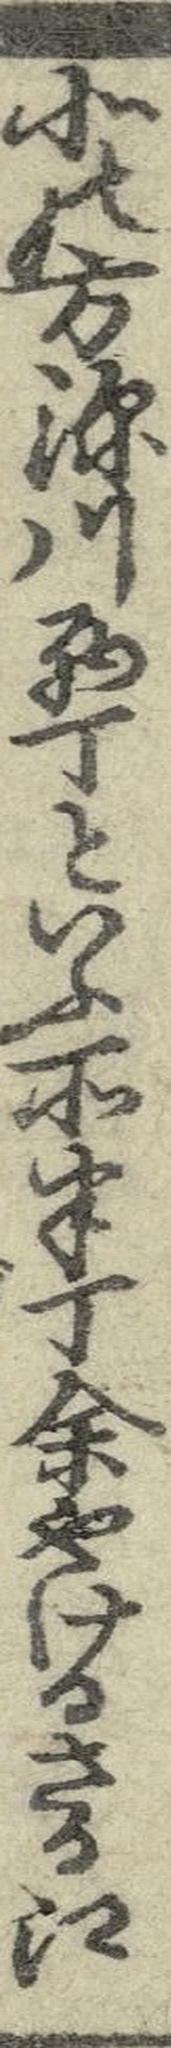北の方深川西丁といふ所半丁余やけるさる江
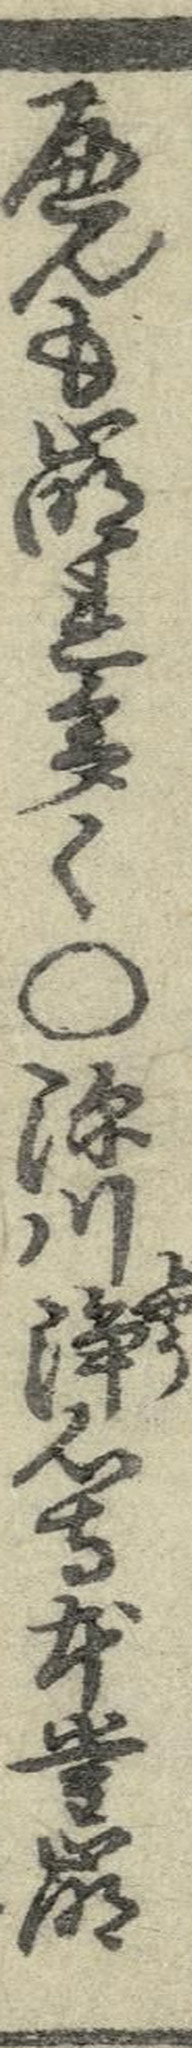へんも崩れ多く〇深川浄心寺本堂崩
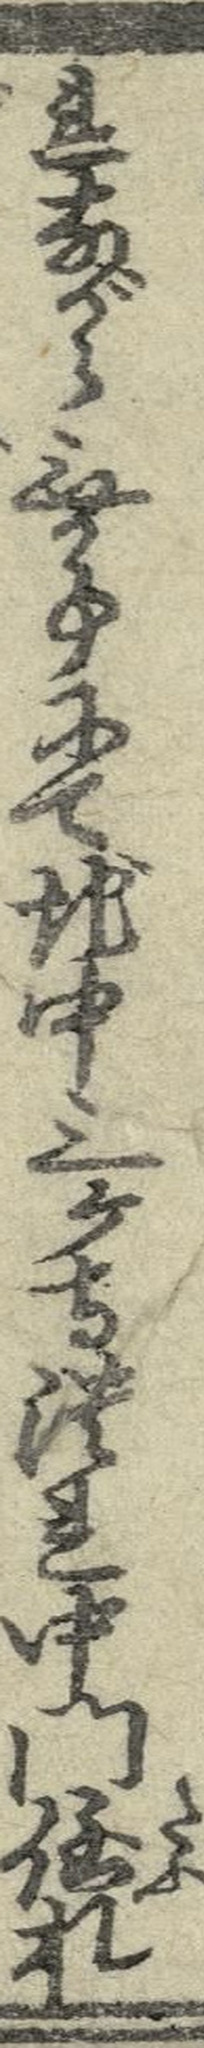れながら無事にて地中三ヶ寺潰れ倒れ
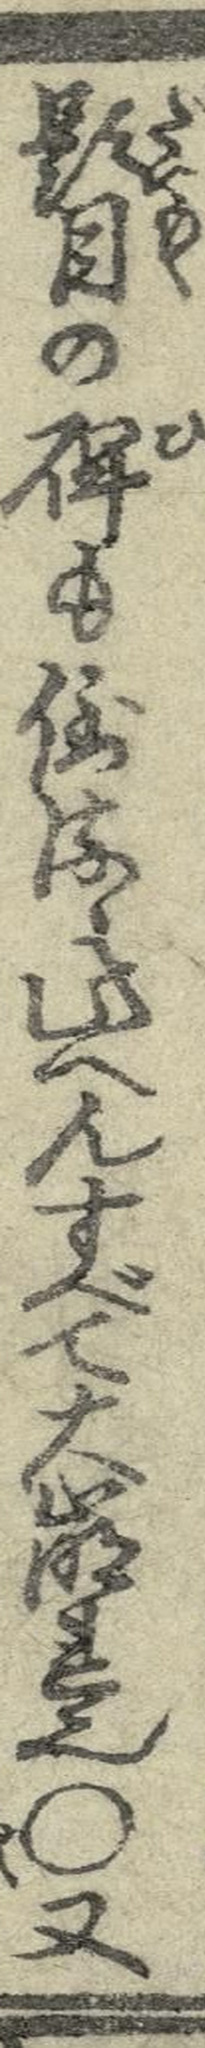題目の碑も倒るゝ此へんすべて大崩れ也〇又
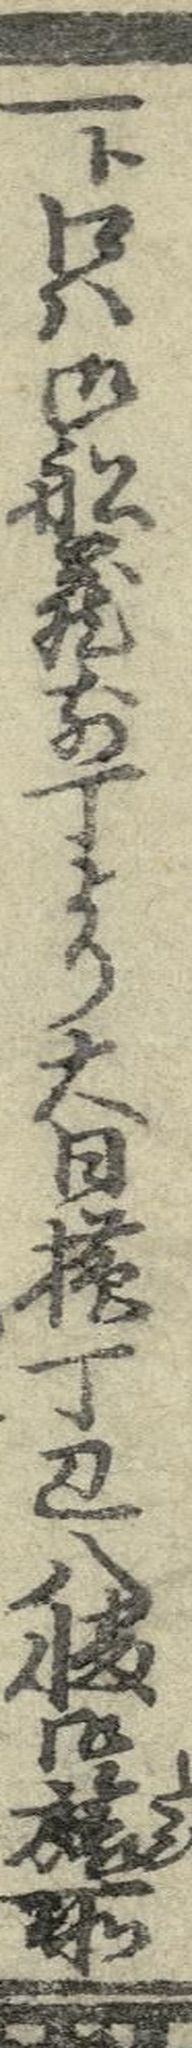一ト口ハ御舩蔵前丁より大日横丁辺八幡御旅所
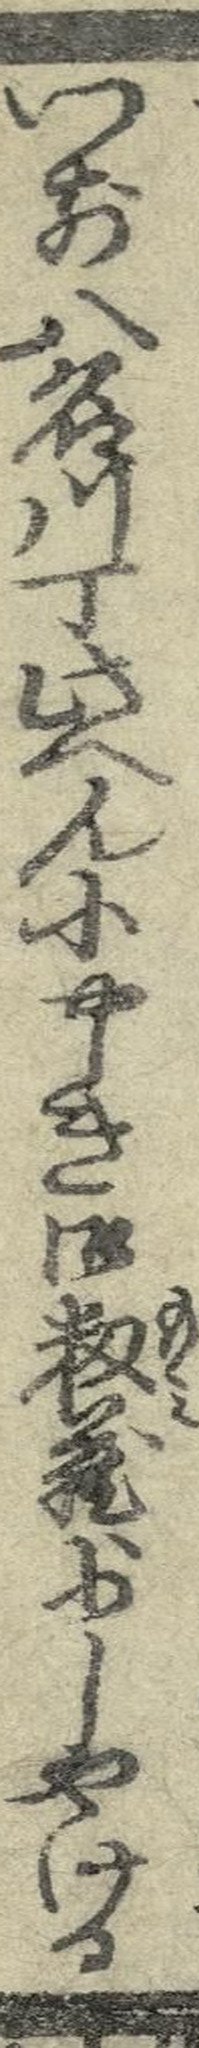門前八名川丁此へん小やしき御籾蔵少しやける
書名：地震並出火細見記
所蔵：東京大学地震研究所図書室 Earthquake Research Institute Library, The University of Tokyo, JAPAN
